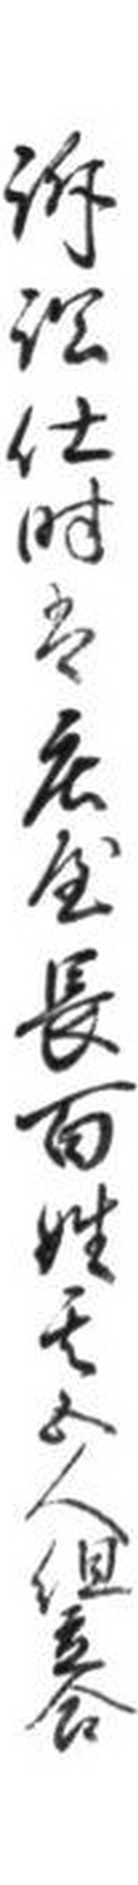訴訟仕時は庄屋長百姓其五人組立合
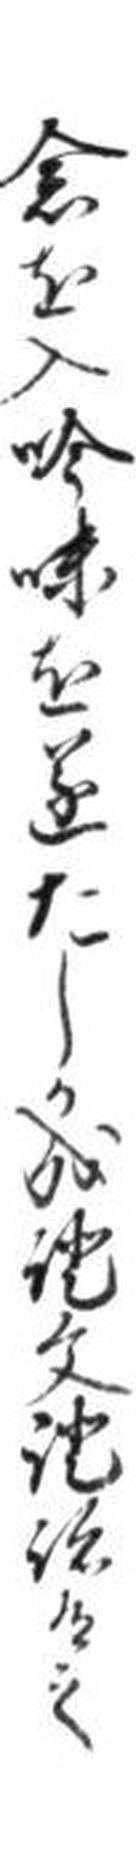念を入吟味を遂たしか成証文証銘有之
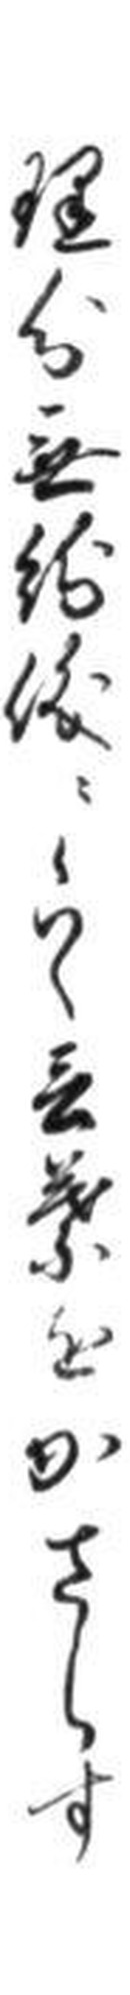理分無紛儀に候はゝ言葉をかさらす
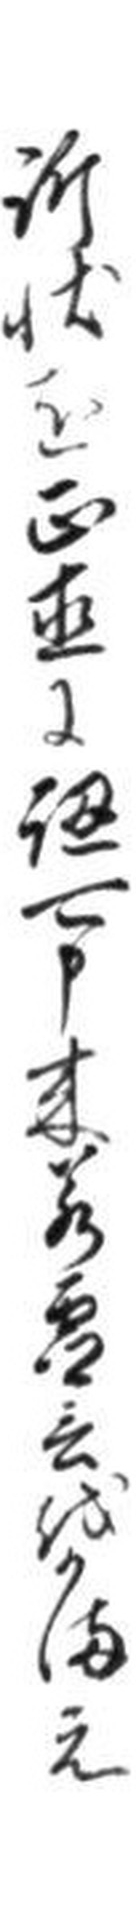訴状をしょう正直に認可申来若虚言をかまえ
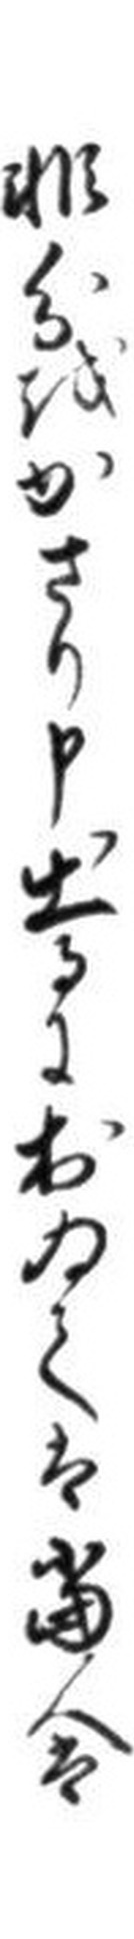非分をかさり申出るにおゐては当人は
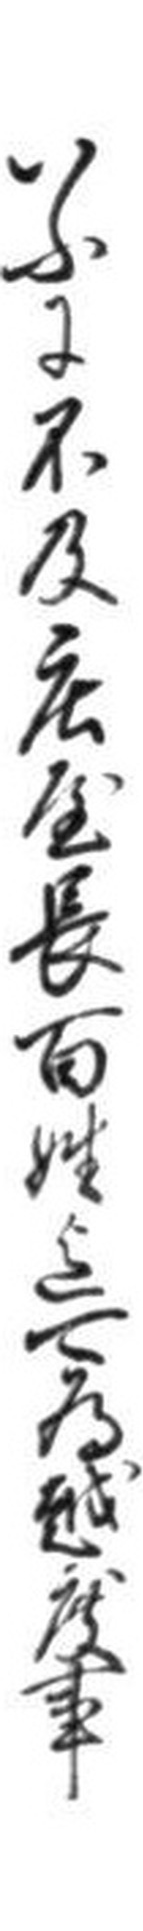いふに不及庄屋長百姓迄可為越度事
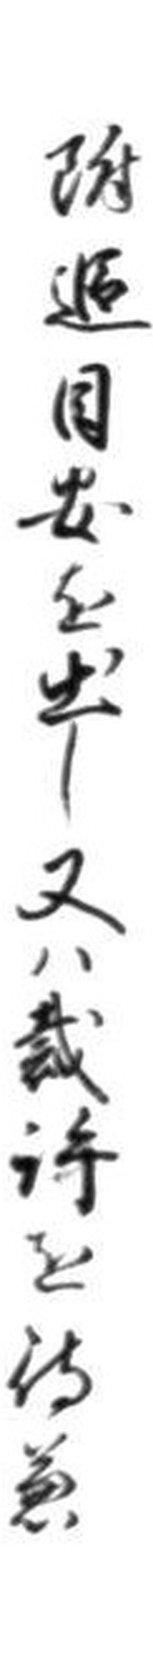附追目安を出し又は裁許を待兼
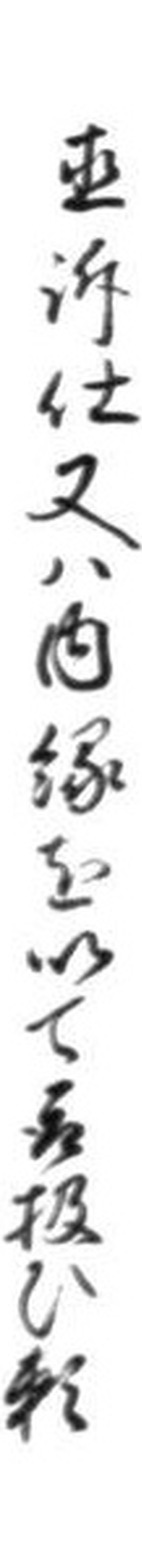直訴紙仕又は内縁を以取扱ひ頼
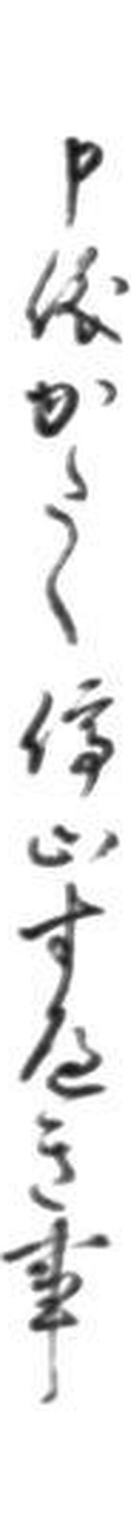申儀かたく停止すへき事
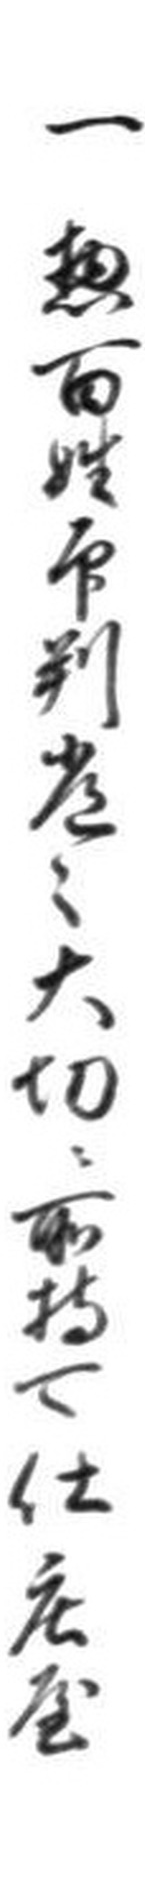一惣百姓印判常々大切に取持可仕庄屋
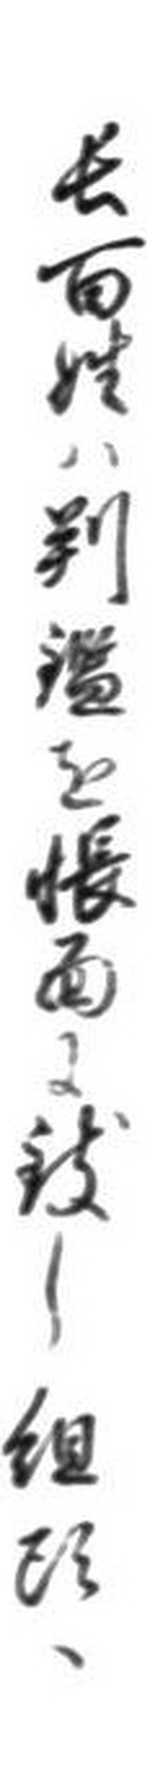長百姓は判鑑を帳面に致し組頭へ
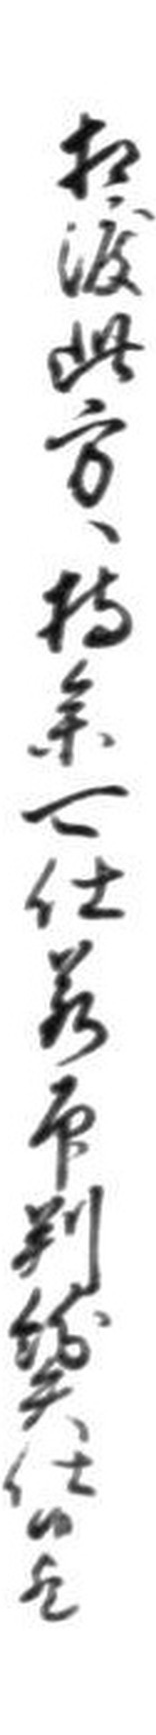相渡此方へ持参可仕若印判紛失仕候歟
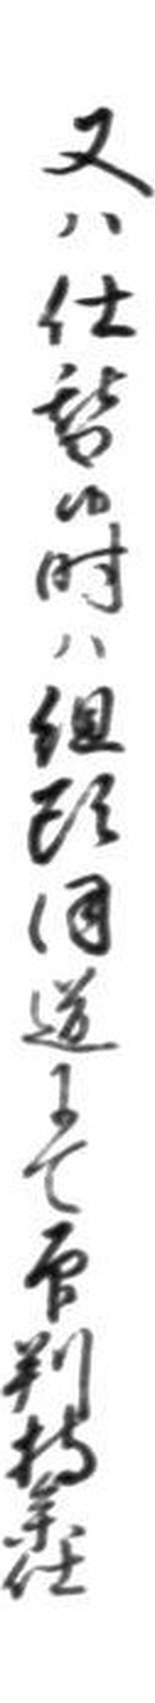又は仕替候時は組頭同道にて印判持参仕
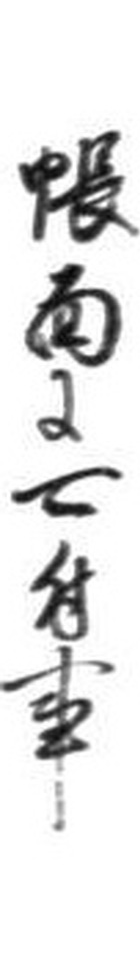帳面に可付事
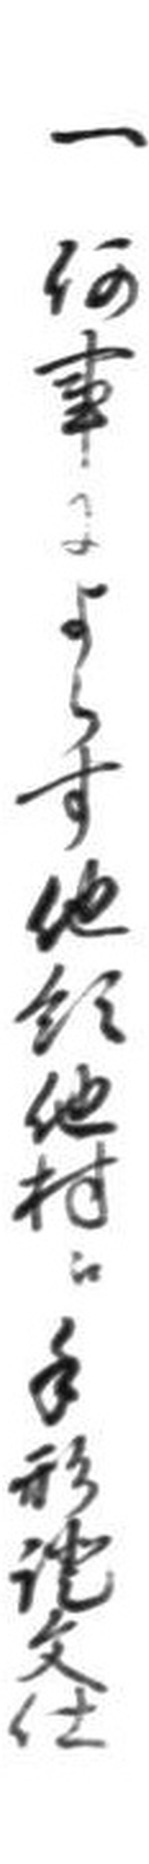一何事によらす他領他村え手形証文仕

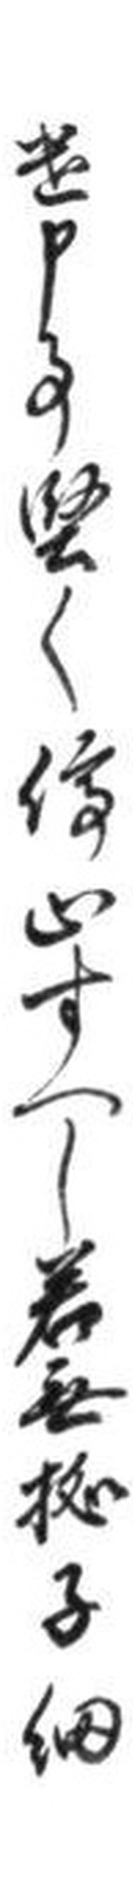遣申事堅く停止すへし若無拠子細
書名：家譜 十六 吉品公 従貞享三年閏三月到同四年
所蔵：福井県文書館 Fukui Prefectural Archives
